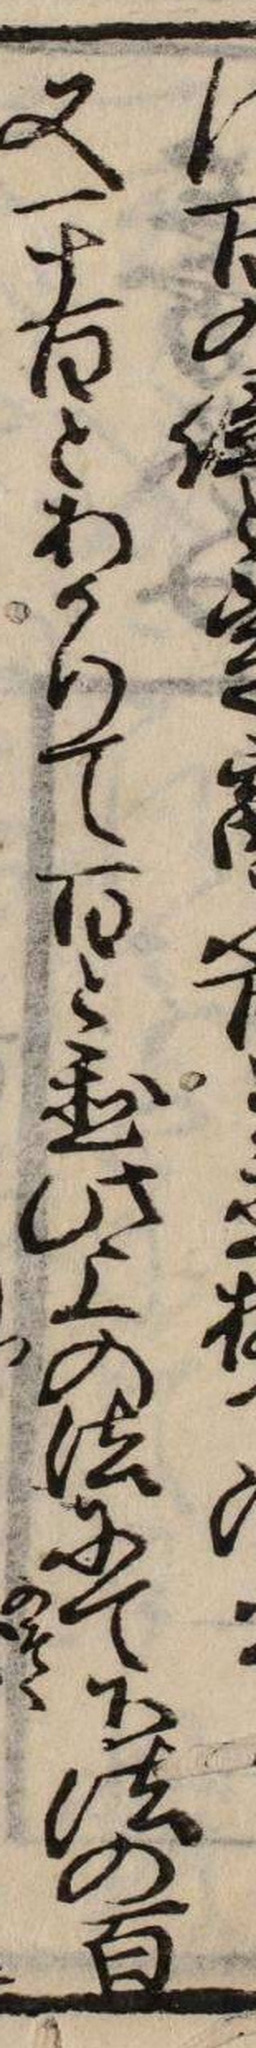又一十百とあかりて百と置此上の法にて下法の百
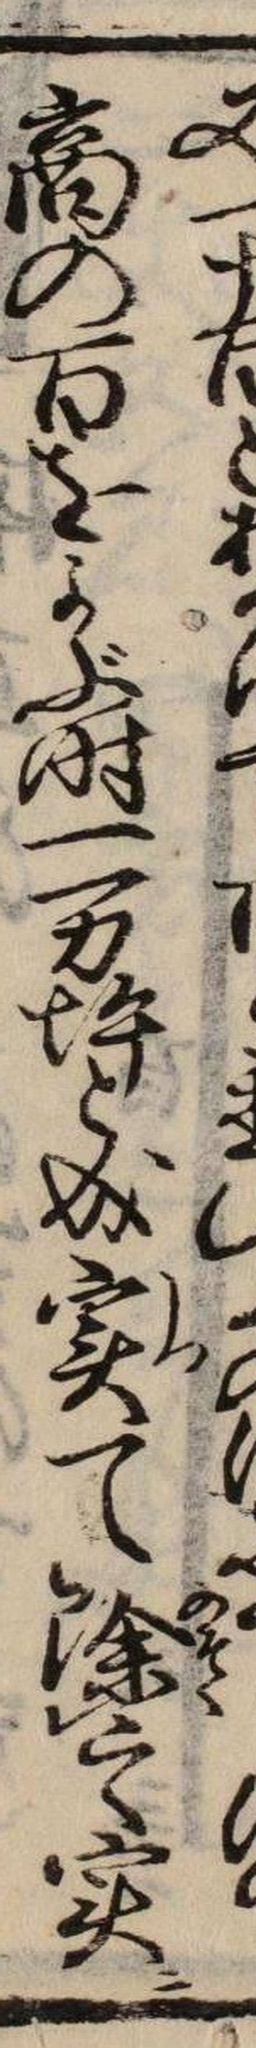商の百をよぶ時一万坪と成実て除之実に
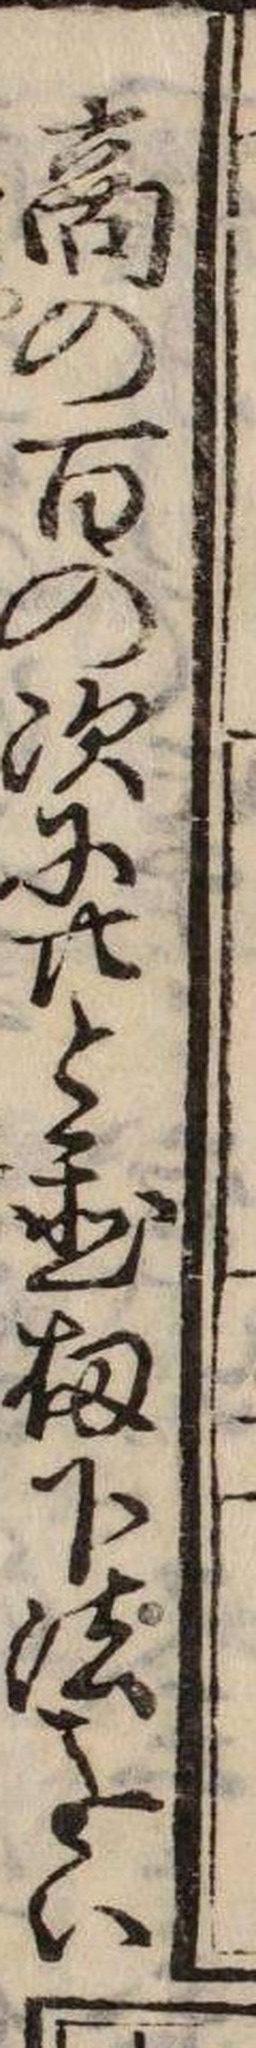商の百の次に廿と置扨下方法をい
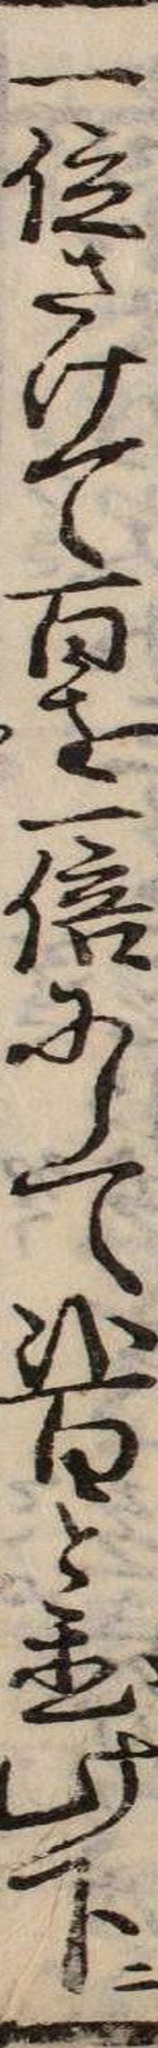一位さけて百を一倍にして弐百と置此下に
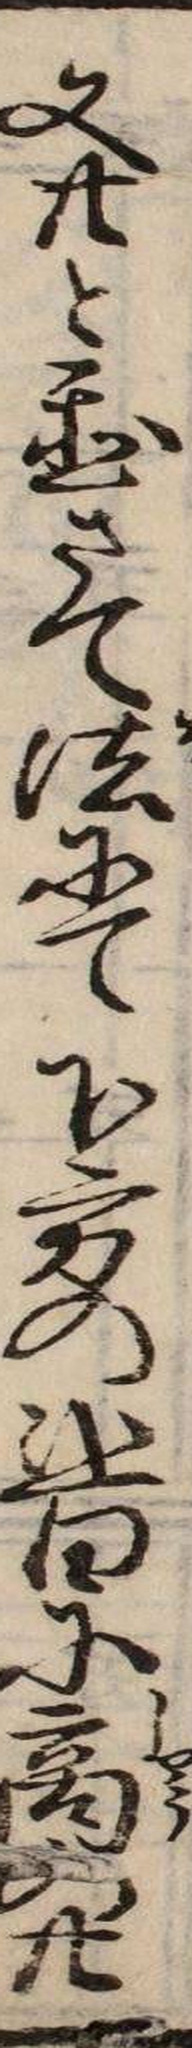又廿と置さて法にて下方の弐百に商の廿
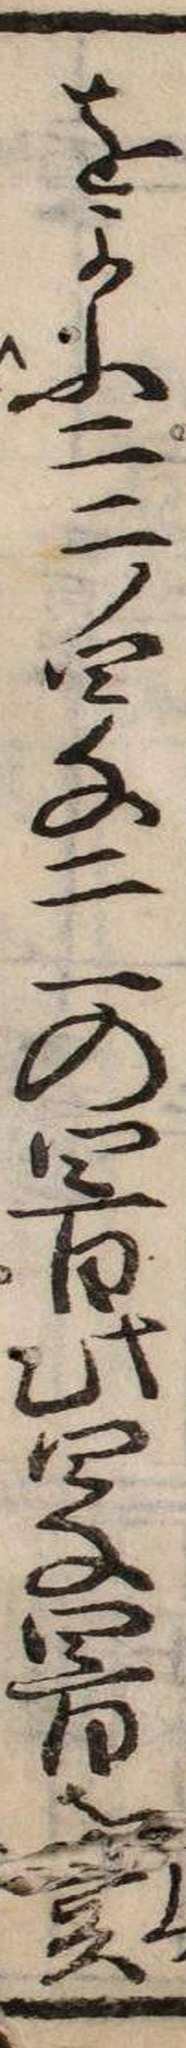をよふ二二の四千二一の四百此四千四百を実
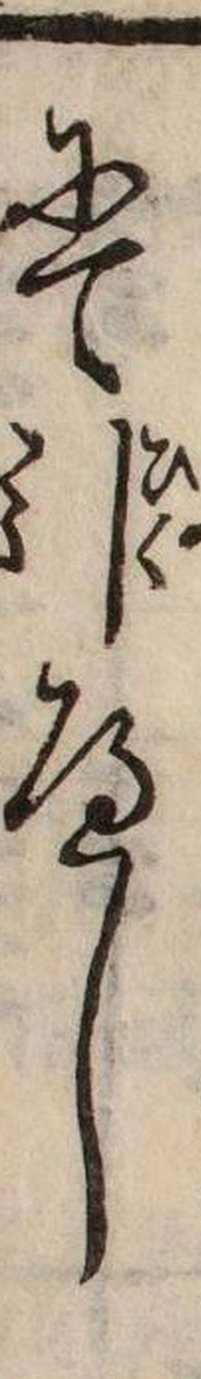にて引へし
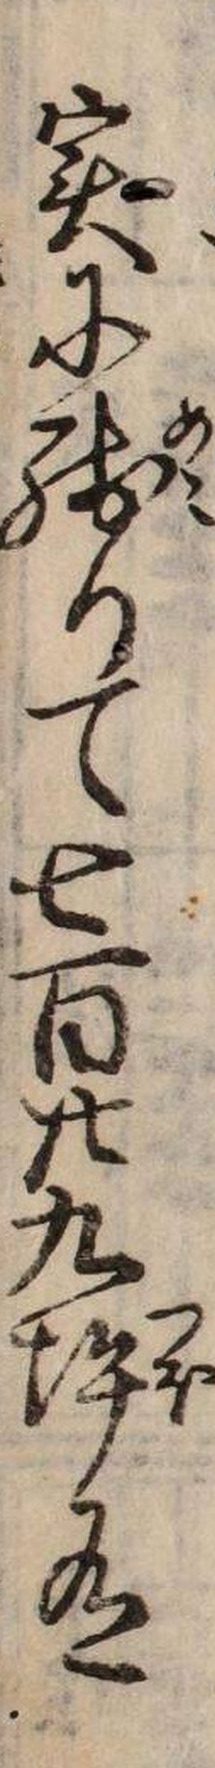実に残りて七百廿九坪有

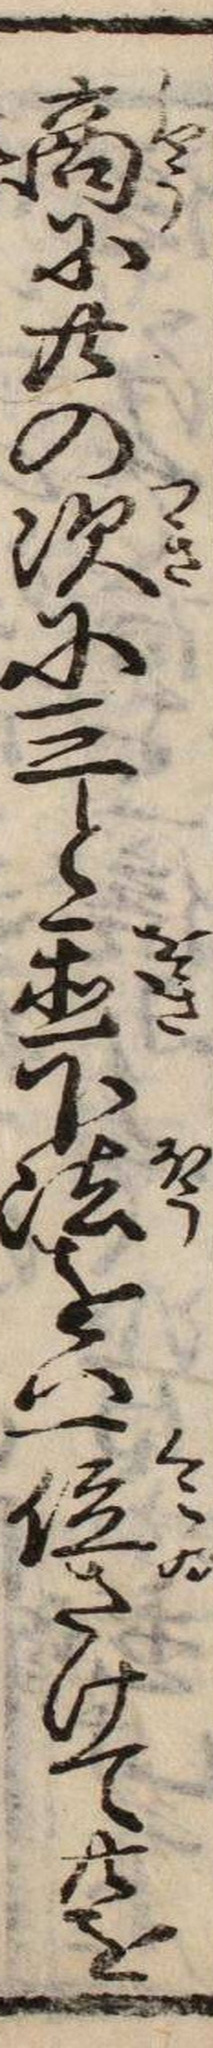商に廿の次に三と置下法をは一位さけて廿を
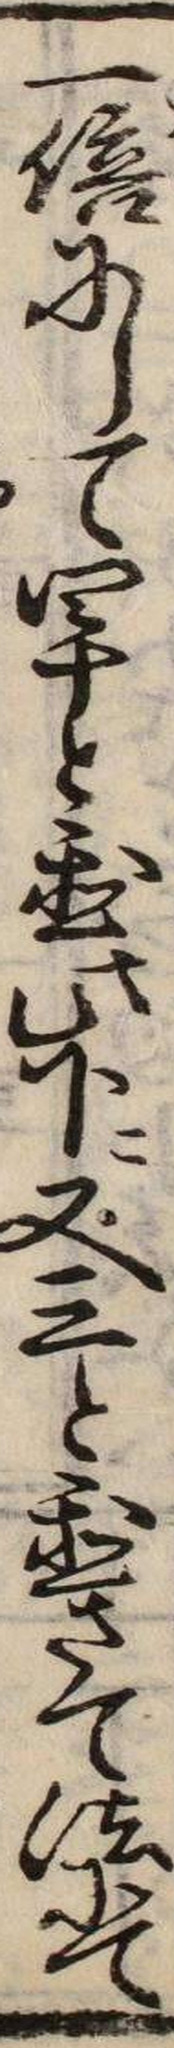一倍にして四千と置此下に又三と置さて法にて
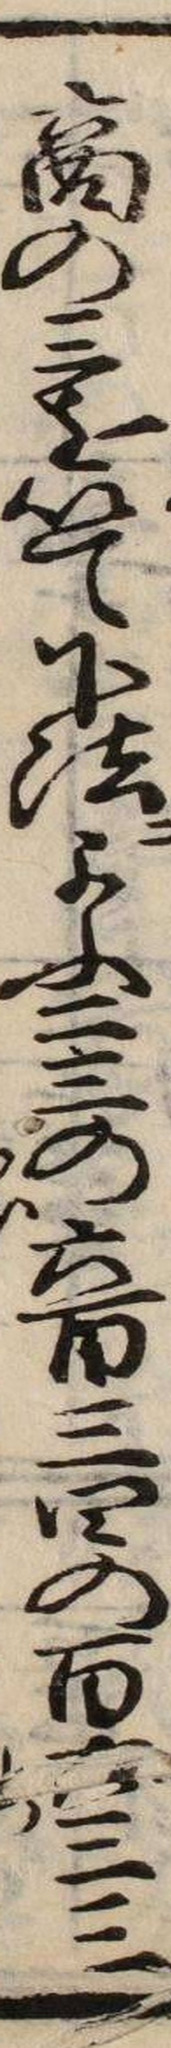商の三を以て下法によふ二三の六百三四の百廿三三
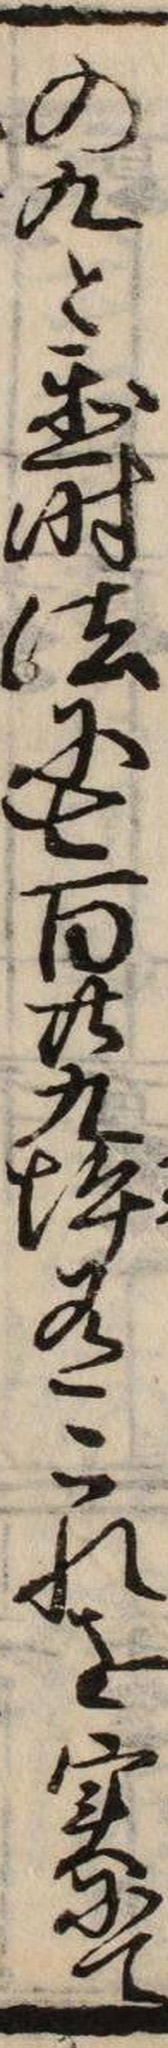の九と置時法に七百廿九坪有これを実にて
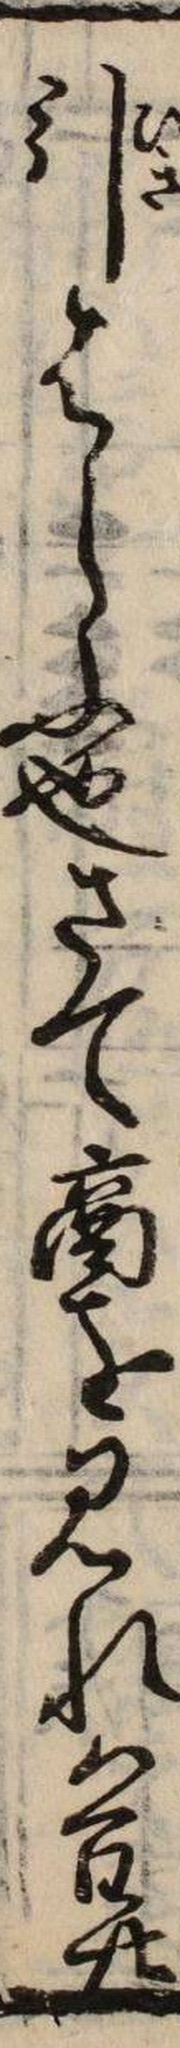引はらふ也さて商を見れは百廿
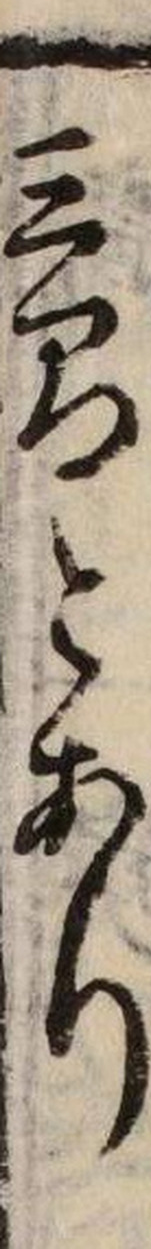三間とあり
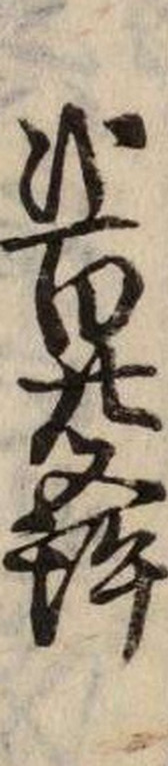弐百廿五坪
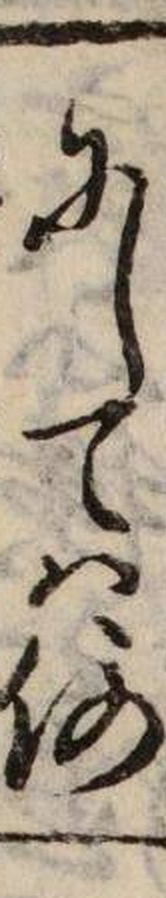にしては何
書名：塵劫記（寛永11年自跋、京都府立京都学・歴彩館追貴8）
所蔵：京都府立京都学・歴彩館 国文学研究資料館
